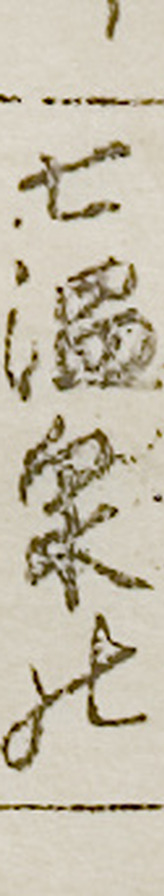七温泉の
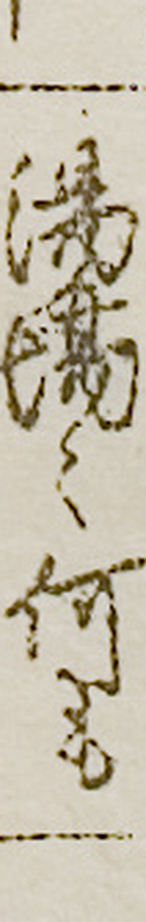湯場の何も
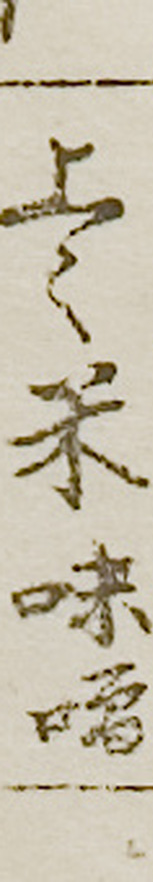上々米味噌
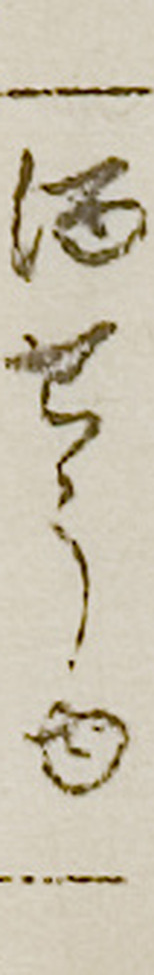酒せうゆ
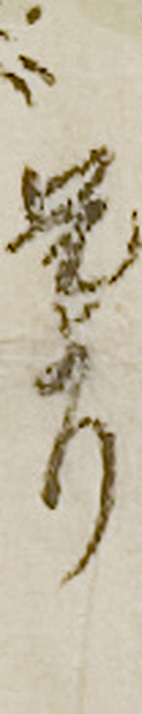是より
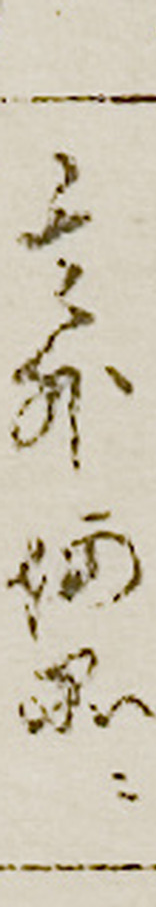其外物品ニ
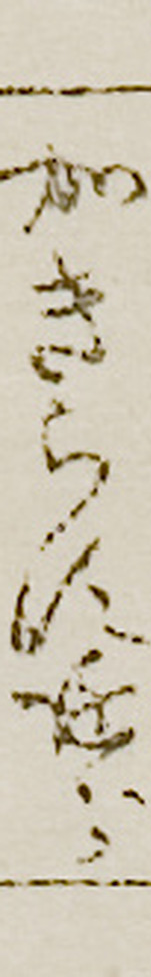かきらす随分
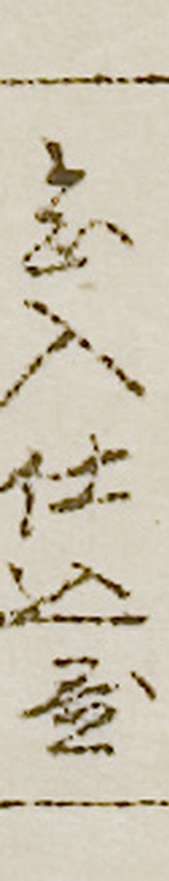念入仕込置
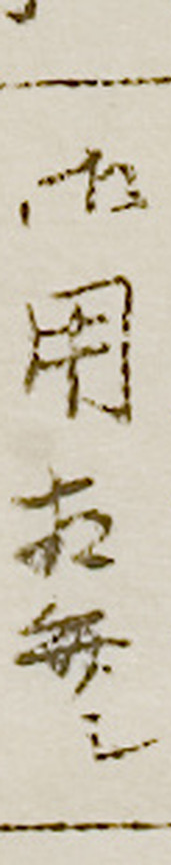御用相弁シ
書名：箱根七温泉図
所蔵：東京大学総合図書館 General Library in the University of Tokyo, JAPAN
